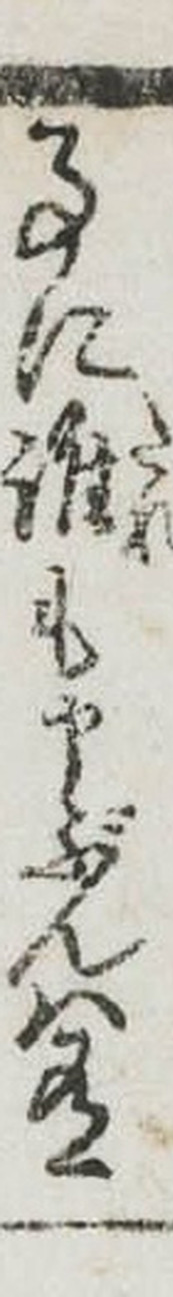事に誰も申ぶんは有
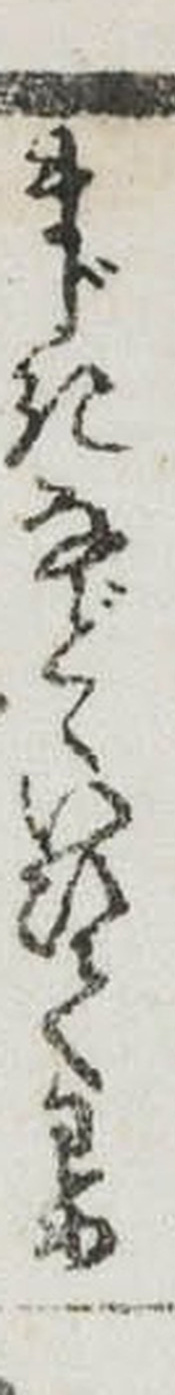まじきなどゝいひてわめ
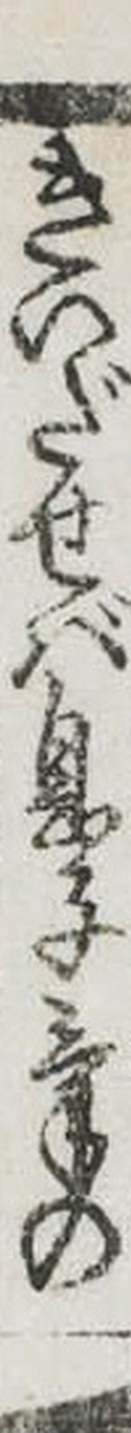きいだせば息子気の
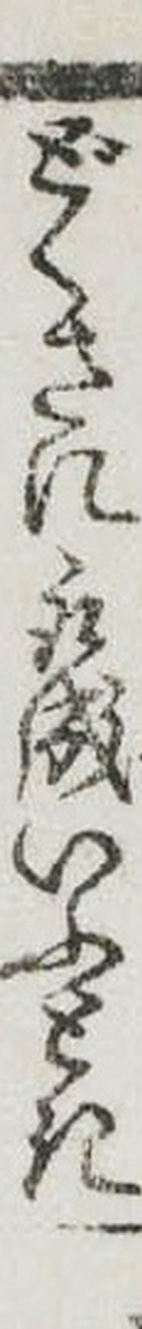どくさに取成いふとき
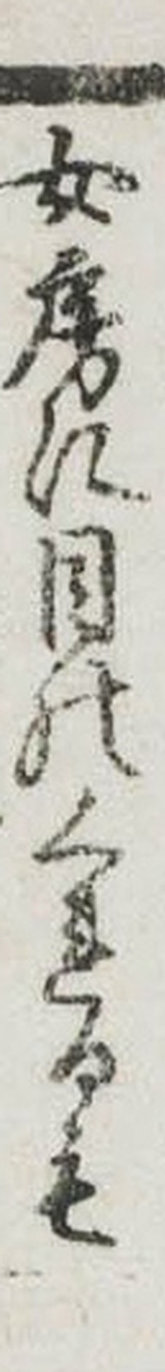女房に目のくれるも
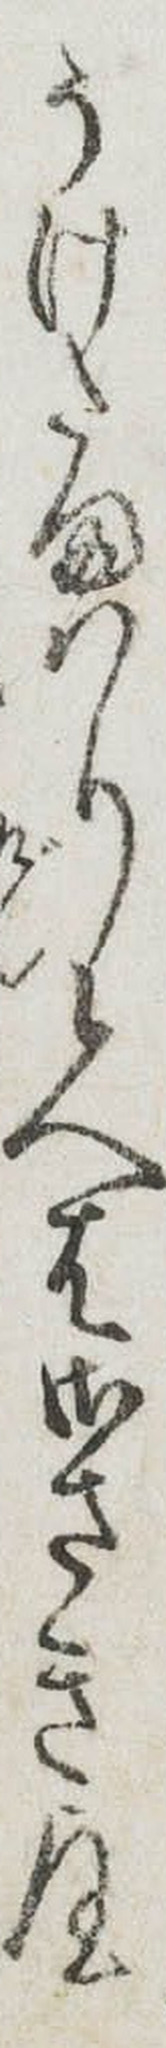うけたまはり候へは御さきさま
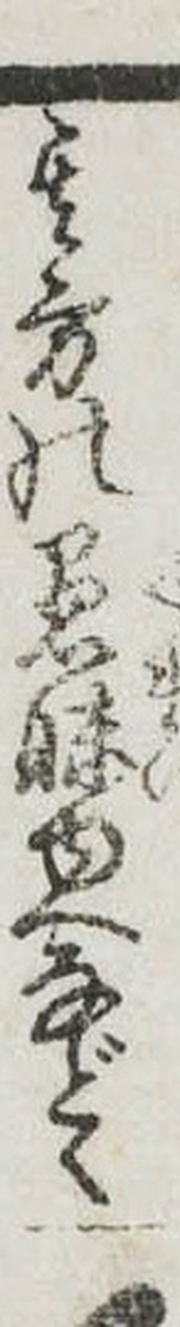其方の愚昧ゆへなどゝ
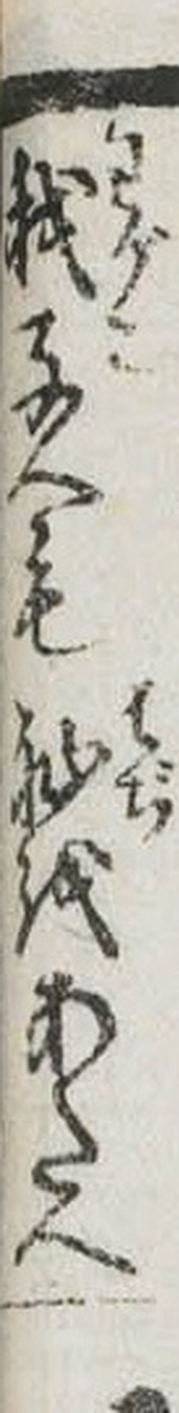我子へも恥をあたへ
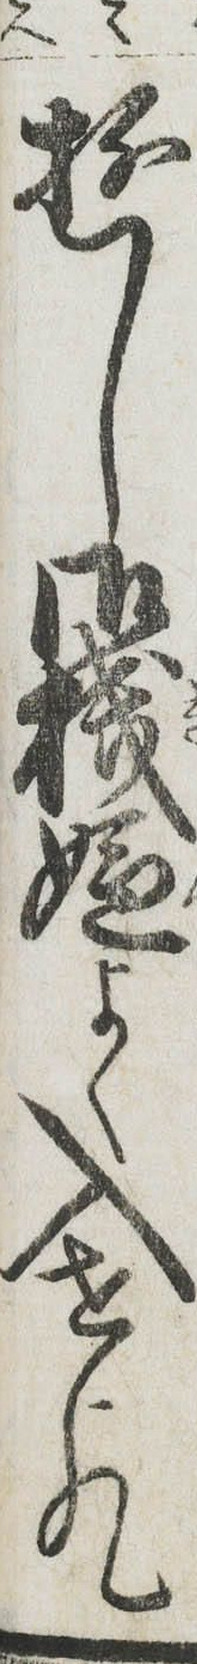遊し御機嫌よく入せられ
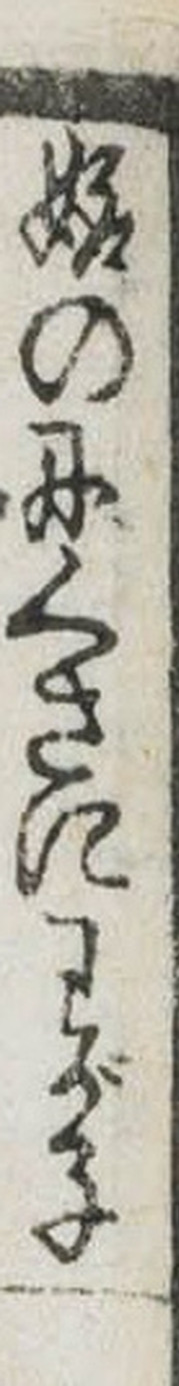娵のにくさにわが子
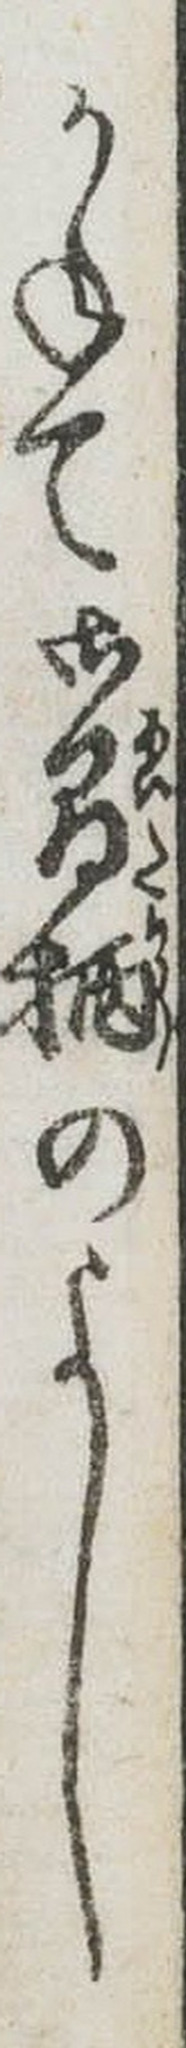かねて御間柄のよし
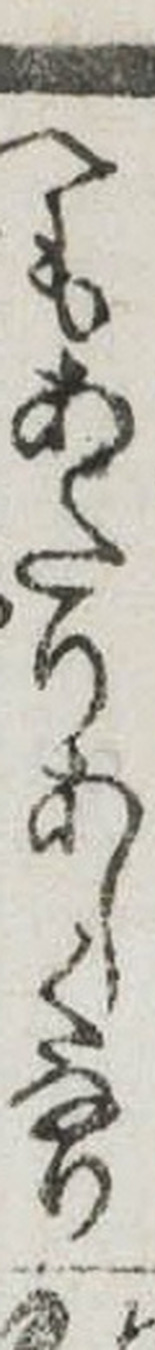へもあたりあしくなり
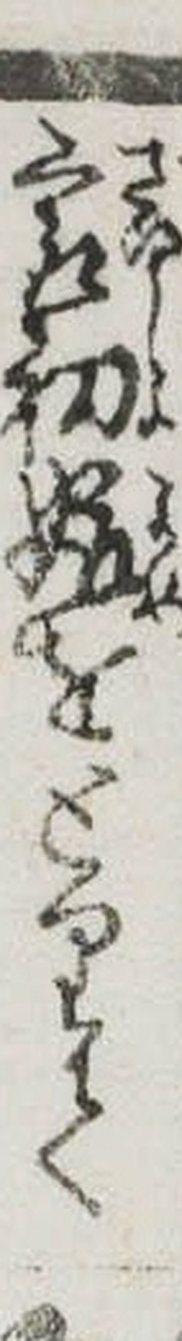最初娵をとりて
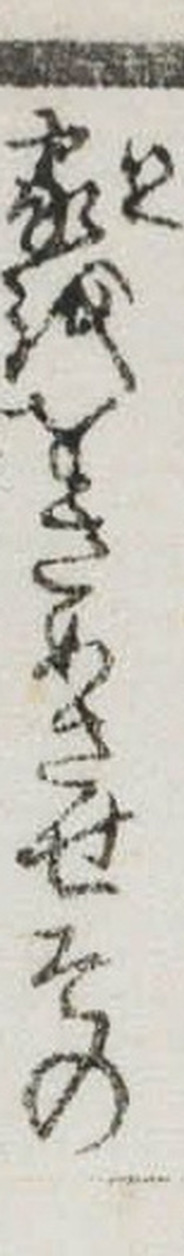家ををさめさせその
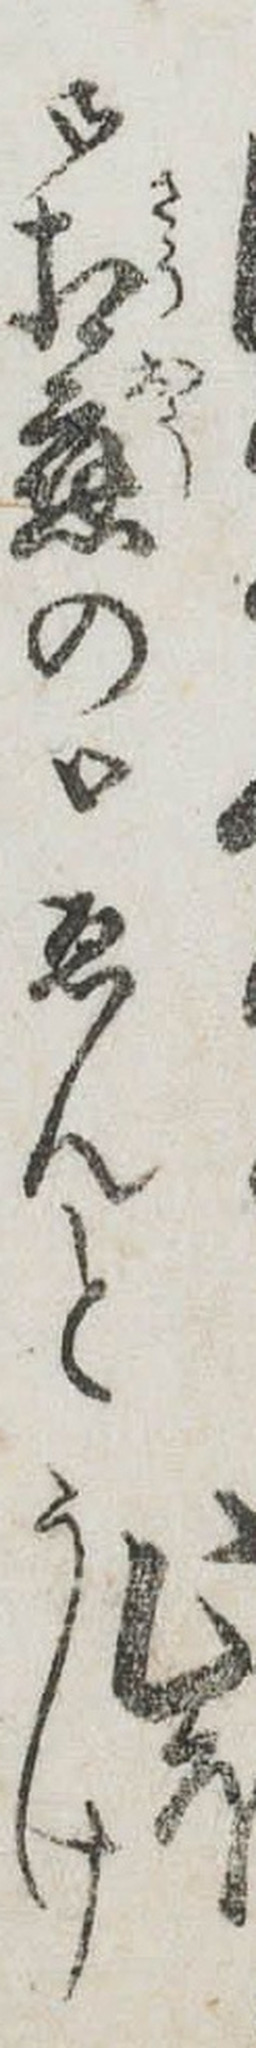御相応の御ゑんとうけ
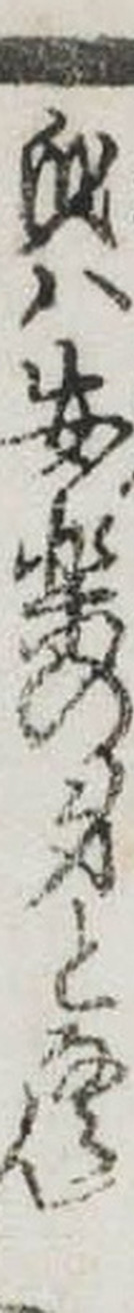身は安楽の身とならん
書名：頭書萬用婦人手紙之文言
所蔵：東京学芸大学教育コンテンツアーカイブ
